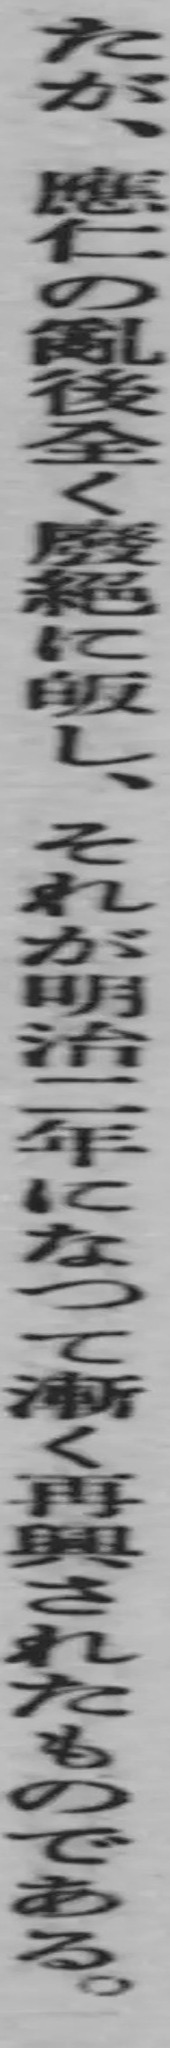たが、應仁の亂後全く廢絕に皈し、それが明治二年になつて漸く再興されたものである。
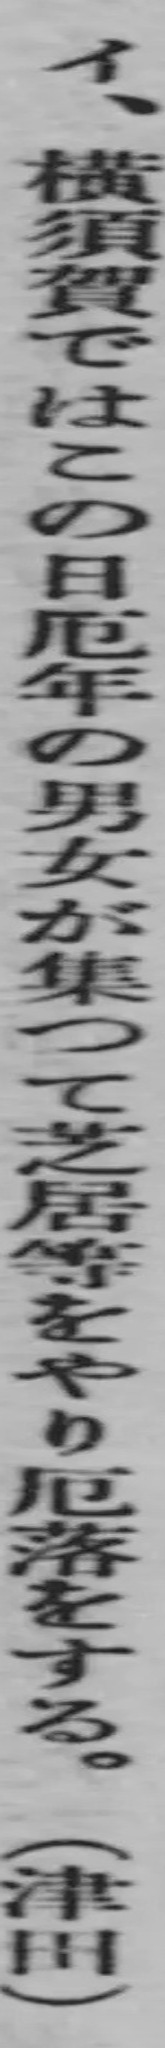イ、横須賀ではこの日厄年の男女が集つて芝居等をやり厄落をする。(津川)
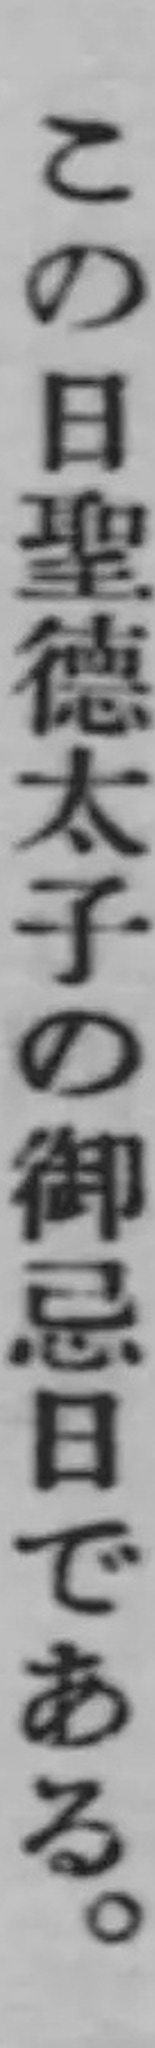この日聖德太子の御忌日である。
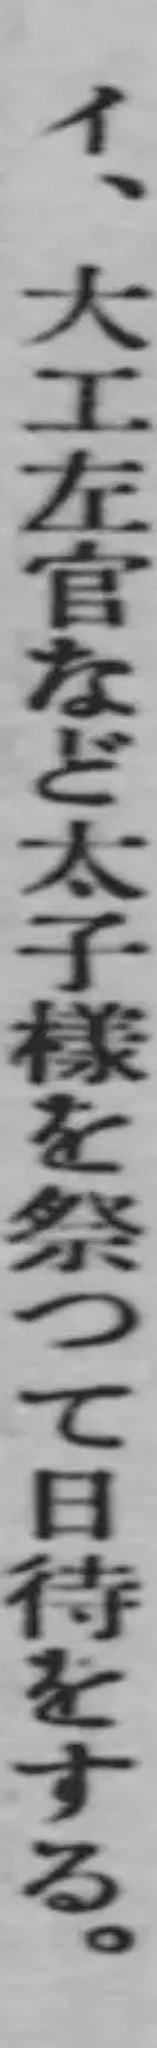イ、大工左官など太子様を祭つて日待をする。(福岡)
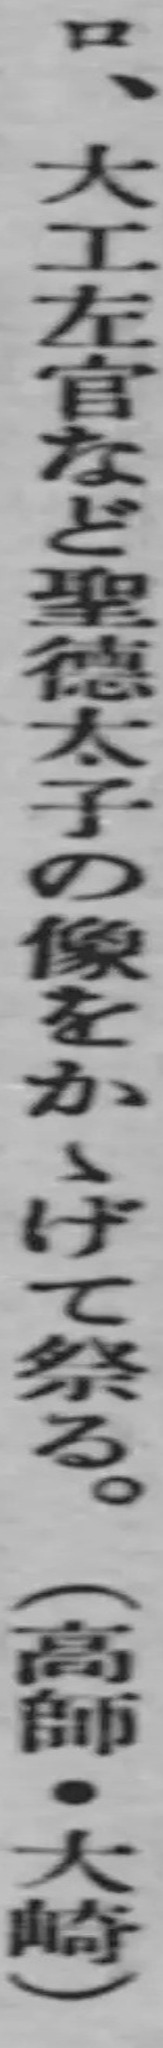ロ、大工左官など聖德太子の像をかゝげて祭る。(高師・大崎)
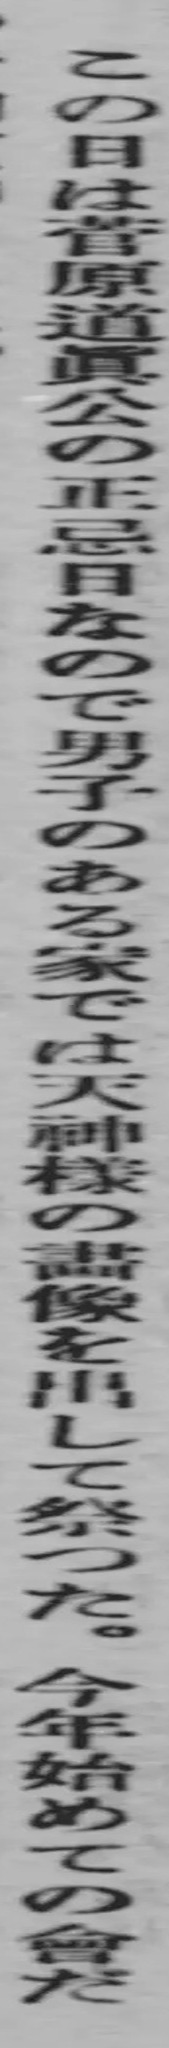この日は菅原道眞公の正忌日なので男子のある家では天神様の畵像を出して祭つた。今年初めての會だ
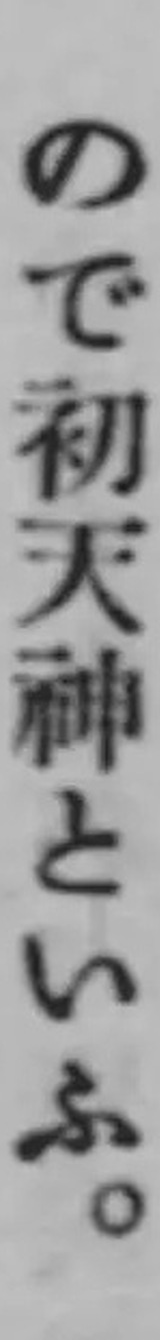ので初天神といふ。
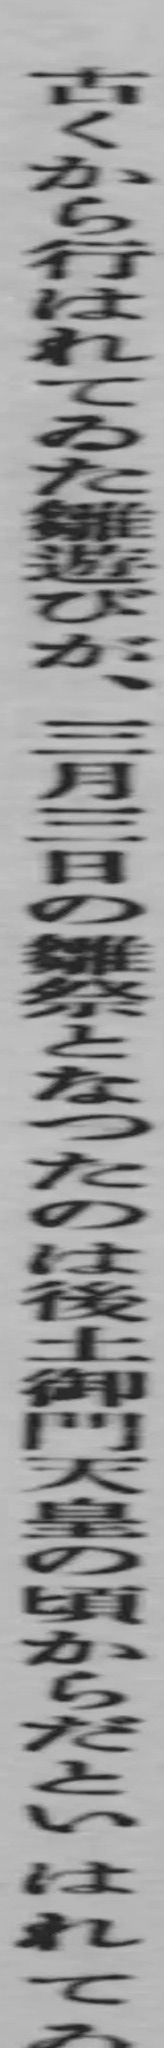古くから行はれてゐた雛遊びが、三月三日の雛祭となつたのは後土御門天皇の頃からだといはれてゐ
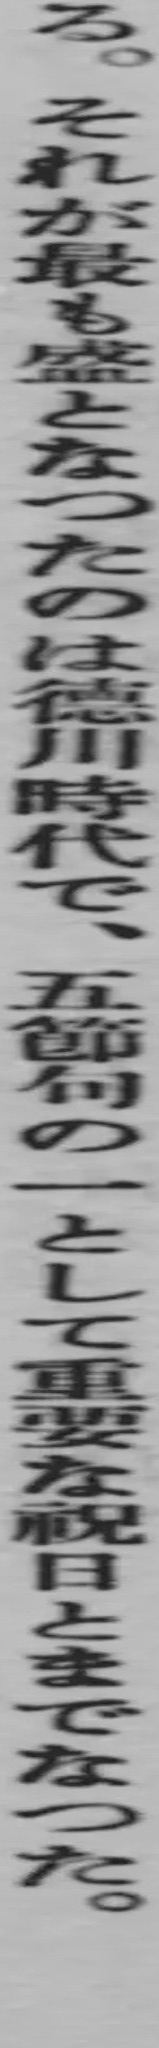る。それが最も盛となつたのは德川時代で、五節句の一として重要な祝日とまでなつた。
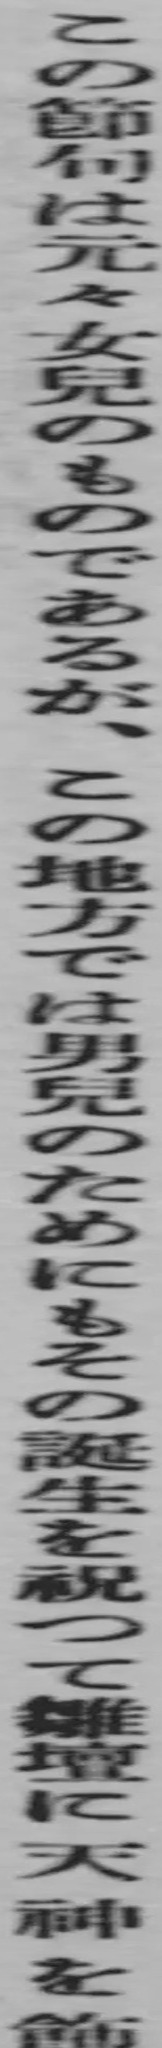この節句は元々女兒のものであるが、この地方では男兒のためにもその誕生を祝つて雛壇に天神を飾
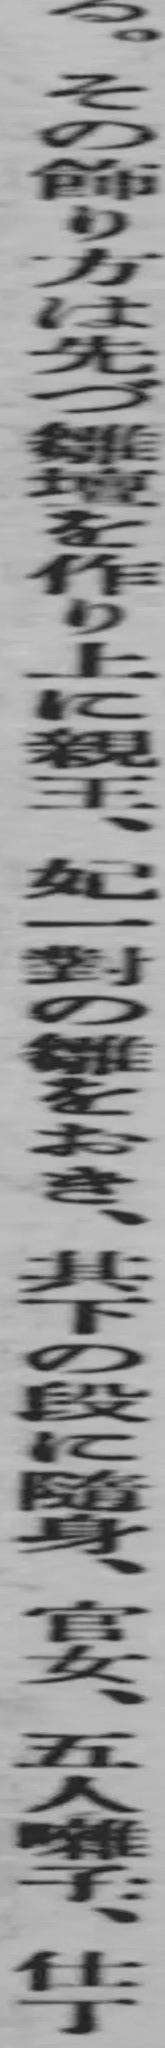る。その飾り方は先づ雛壇を作り上に親王、妃一對の雛をおき、其下の段に隨身、官女、五人囃子、仕丁
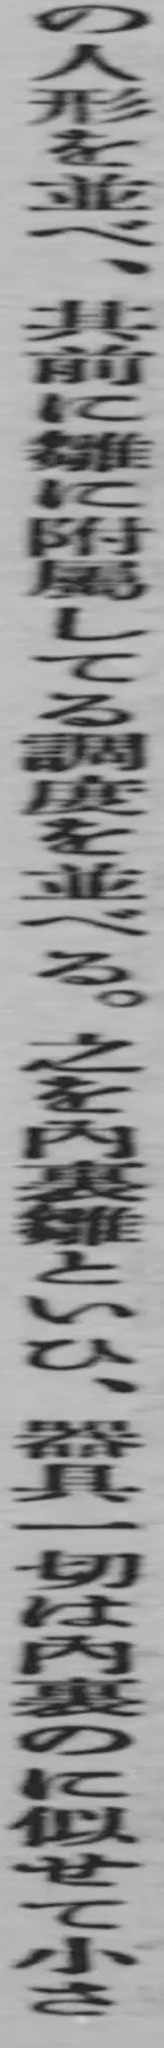の人形を並べ、其前に雛に附屬してる調度を並べる。之を内裏雛といひ、器具一切は内裏のに似せて小さ
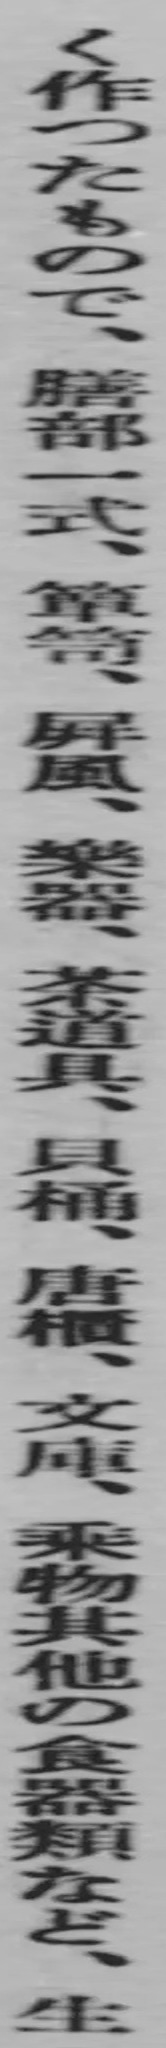く作つたもので、膳部一式、簞笥、屛風、樂器、茶道具、貝桶、唐櫃、文庫、乘物其他の食器類など、生
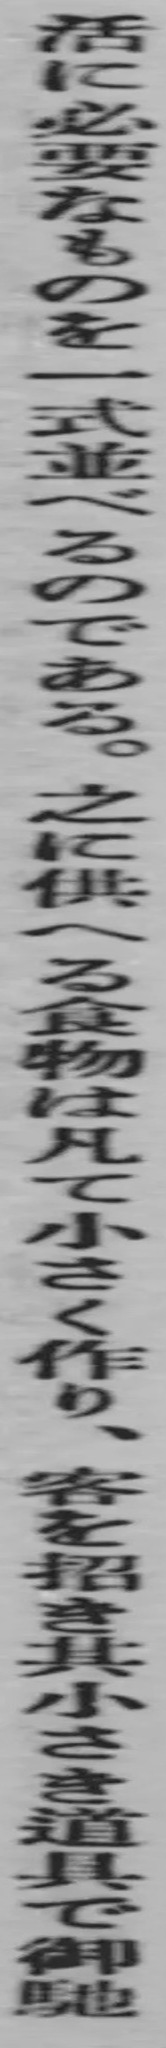活に必要なものを一式並べるのである。之に供へる食物は凡て小さく作り。客を招き其小さき道具で御馳
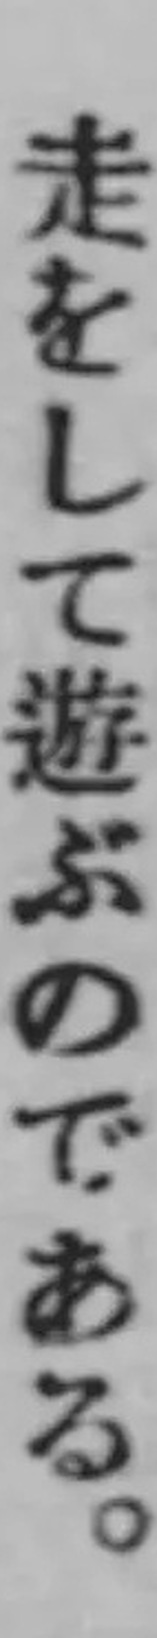走をして遊ぶのである。
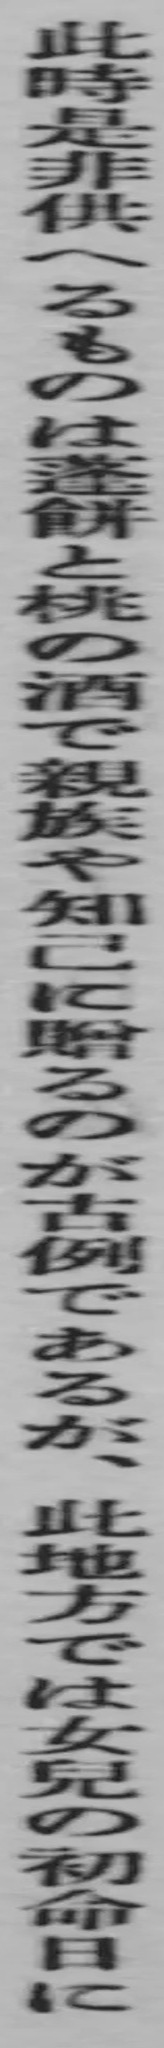此時是非供へるものは蓬餅と桃の酒で親族や知己に贈るのが古例であるが、此地方では女兒の初命日に
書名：豊橋の年中行事
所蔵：国立国会図書館 National Diet Library, JAPAN
